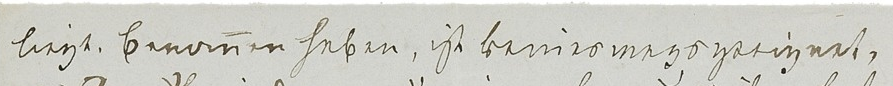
liegt, benommen haben, ist keineswegs geeignet,
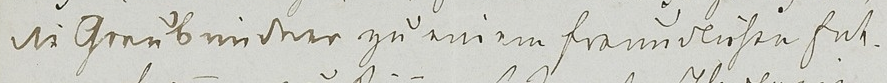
die Graubündner zu einem freundlichen Ent-
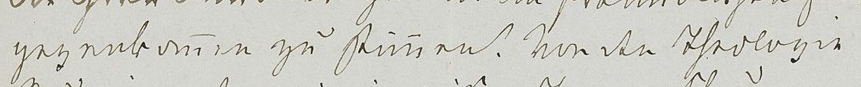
gegenkommen zu stimmen. Von den Theologie
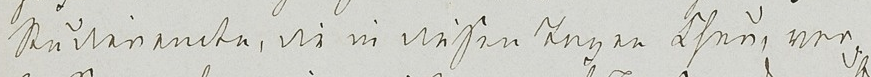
Studierenden, die in diesen Tagen Chur, ver-
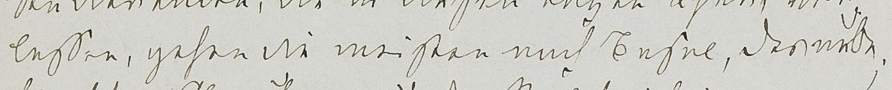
lassen, gehen die meisten nach Basel, des unbe-
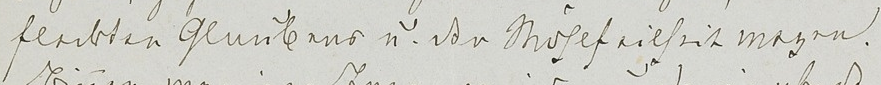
fleckten Glaubens u. der Wohlfeilheit wegen.
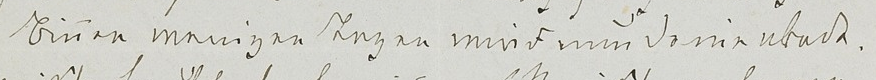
Binnen wenigen Tagen wird nun diese akade-
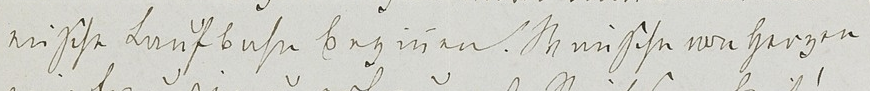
mische Laufbahn beginnen. Wünsche von Herzen
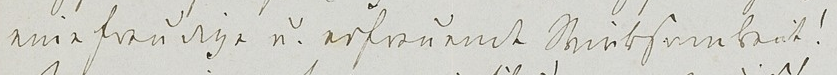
eine freudige u. erfreuende Wirksamkeit!
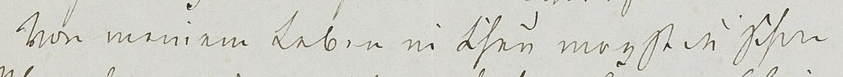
Von meinem Leben in Chur magst du schon
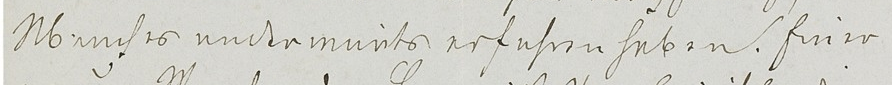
Manches anderwärts erfahren haben. Einer
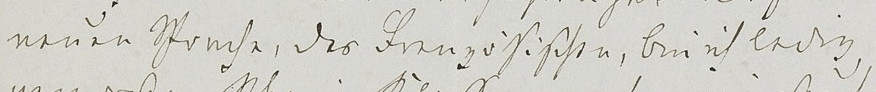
neuen Sprache, des Französischen, bin ich ledig
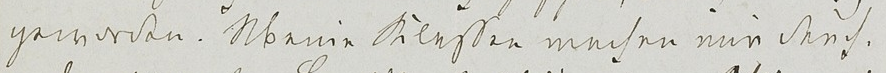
geworden. Meine Klassen machen mir durch-
